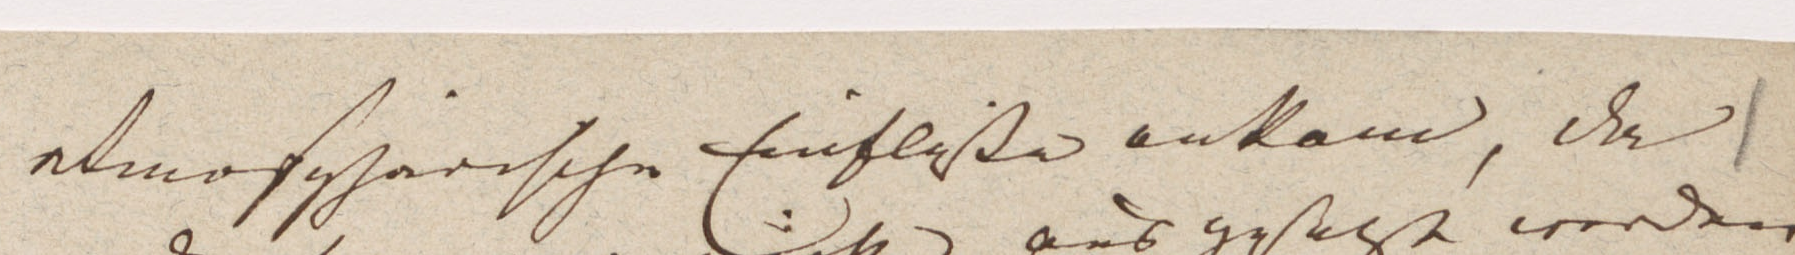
atmossphärische Einflüsse ankam, da
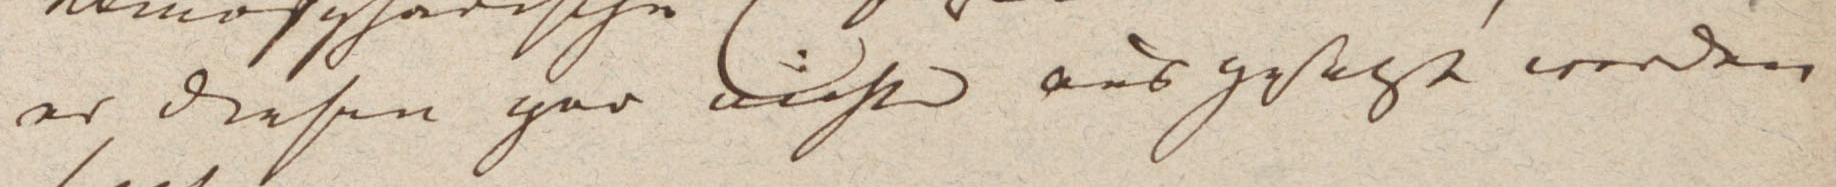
er diesen gar nicht ausgesetzt werden
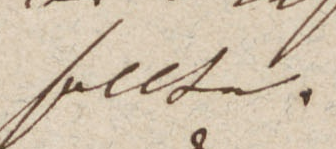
sollte.
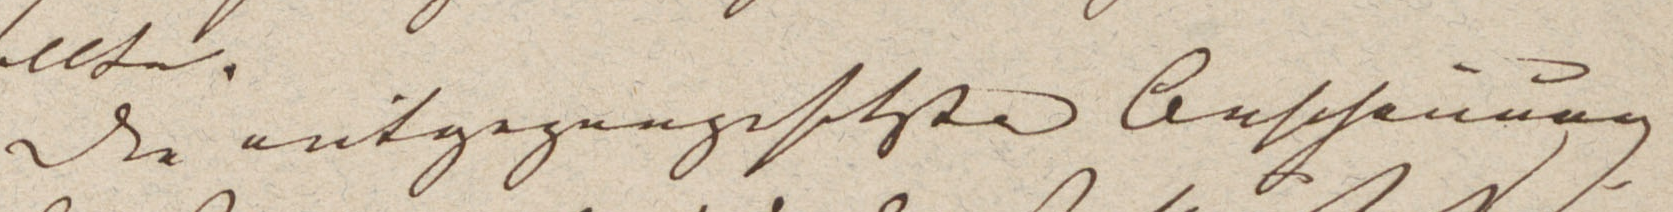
Die entgegengesetzte Anschauung
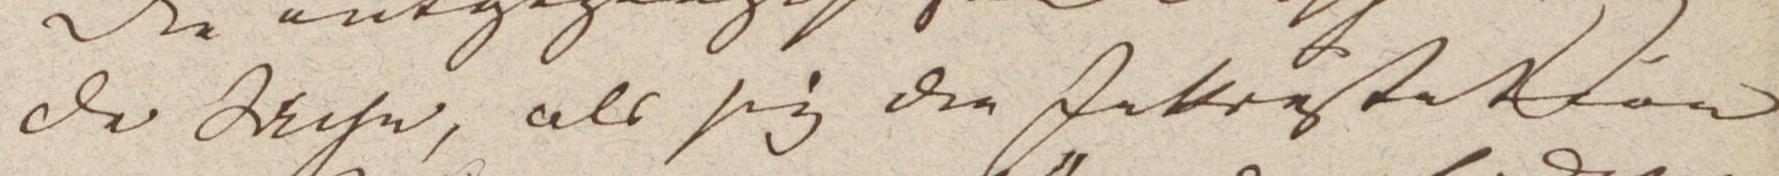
de Sache, als sey die Inkrustation
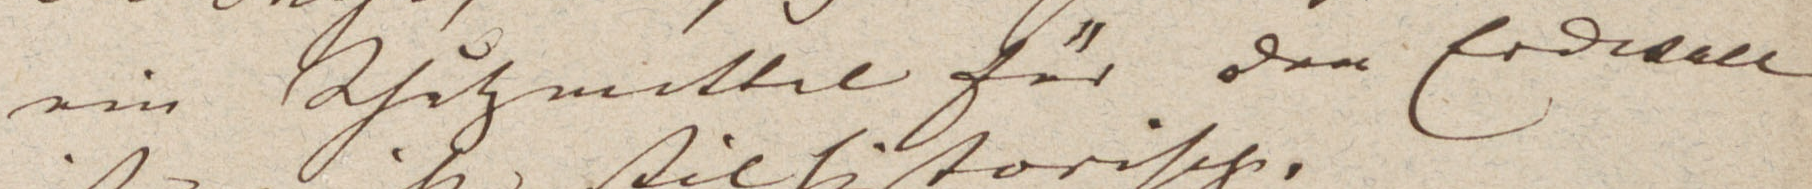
ein Schutzmittel für den Erdwall
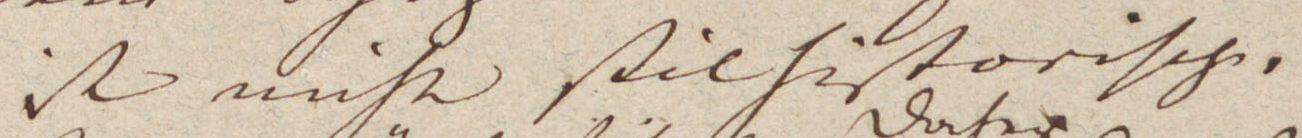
ist nicht stilhistorisch.
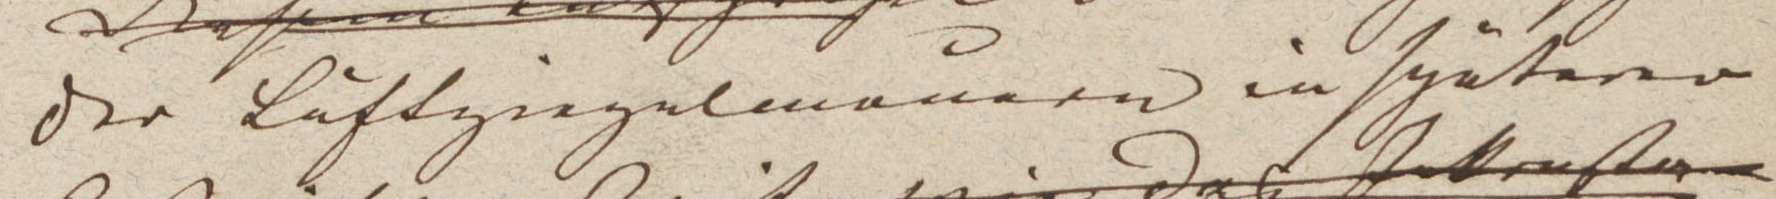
der Luftziegelmauern in späterer
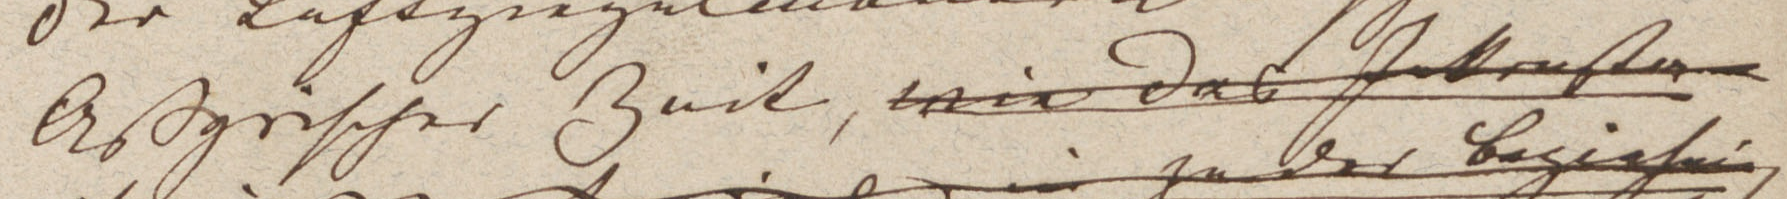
Assyrischer Zeit, wie das Inkrusta-
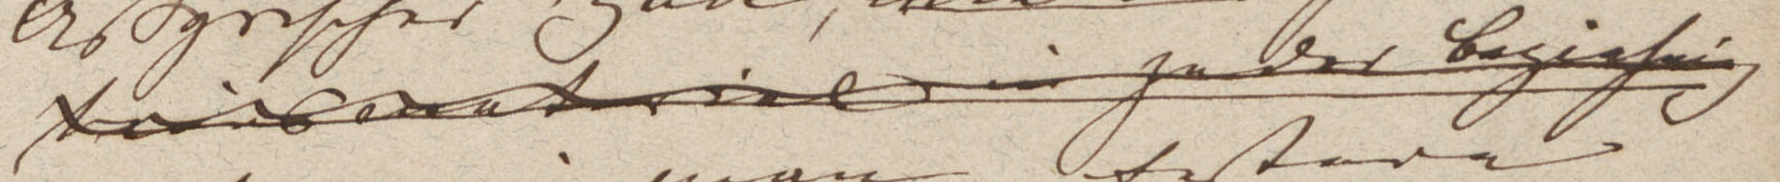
tionsmaterial in jeder Beziehung
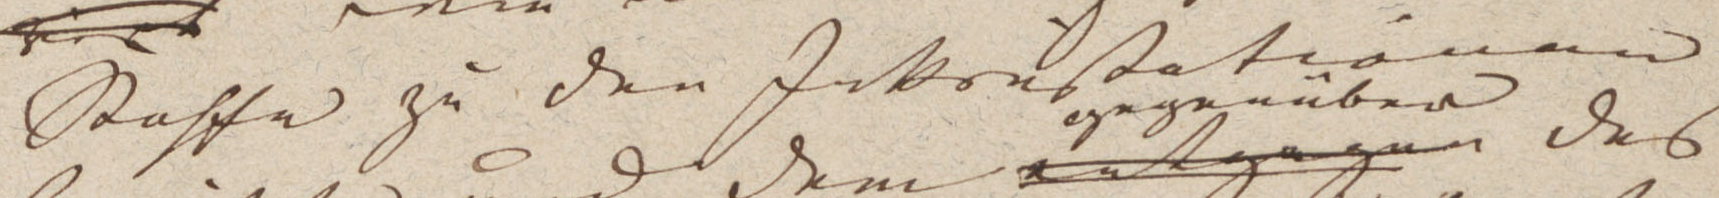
Stoffe zu den Inkrustationen
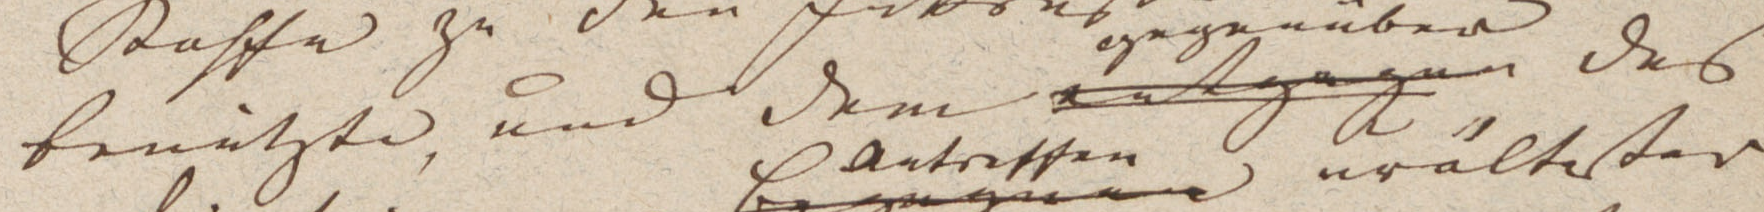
benützte, und dem entgegen gegenüber das
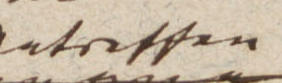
Antreffen
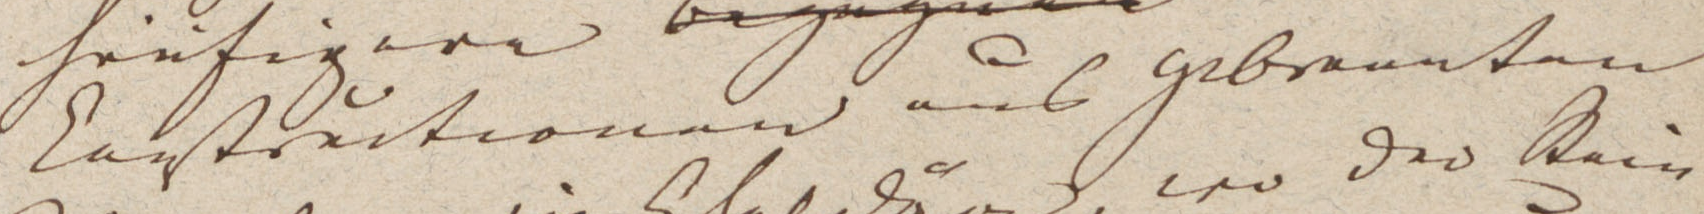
Constructionen aus gebrannten
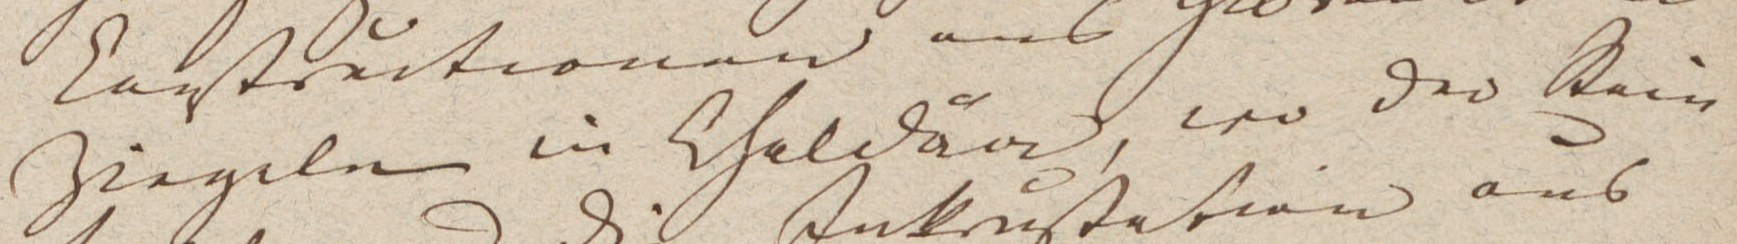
Ziegeln in Chaldäa, wo der Stein
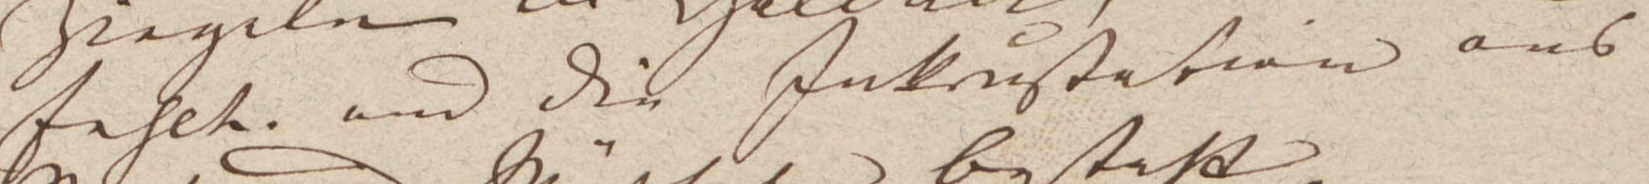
fehlt. und die Inkrustation aus
